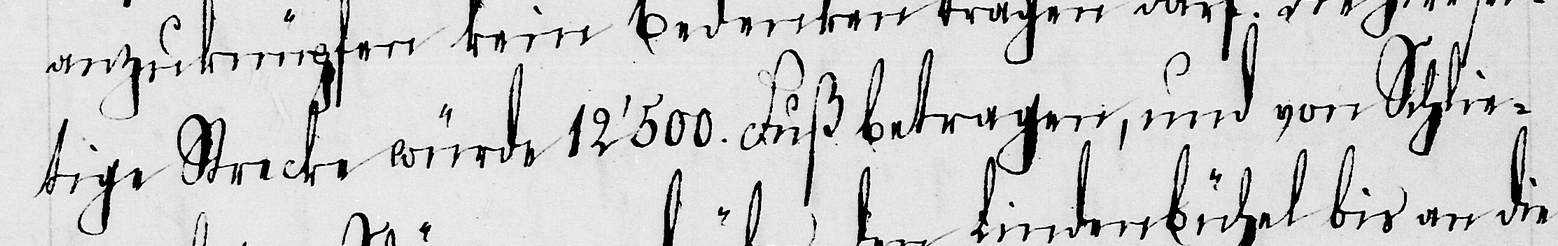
tige Strecke würde 12‘500. Fuß betragen, und von Schlie¬
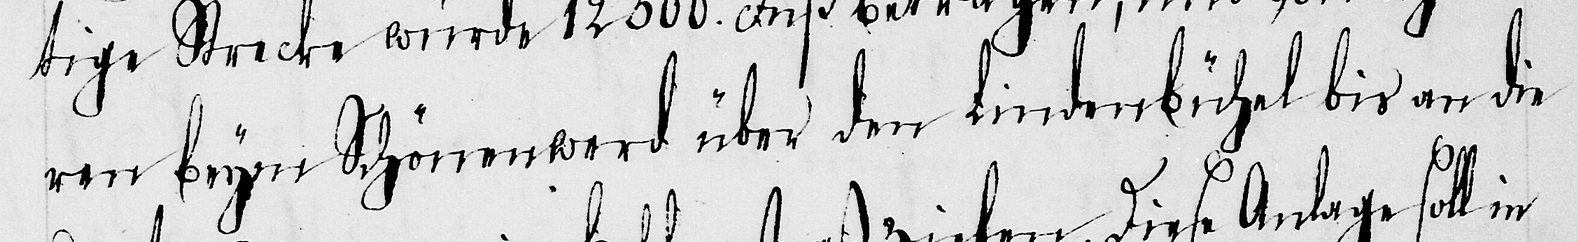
ren beym Schönenwerd über den Lindenbüchel bis an die
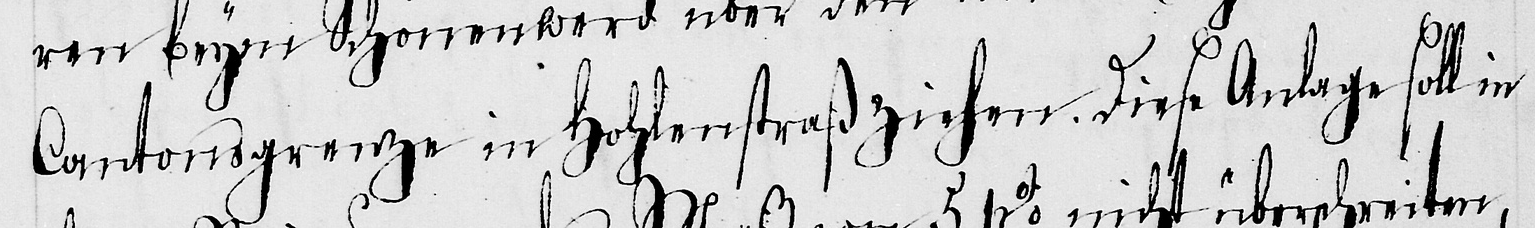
Cantonsgrenze in Hohlenstraß ziehen. Diese Anlage soll in
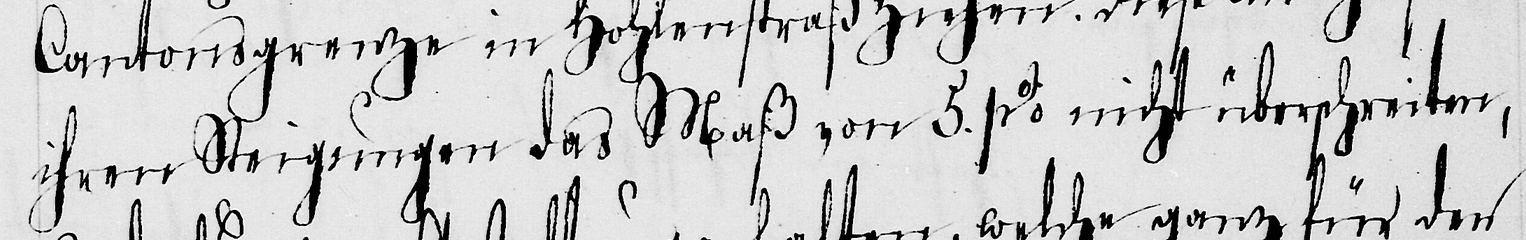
ihren Steigungen das Maß von 5. % nicht überschreiten,
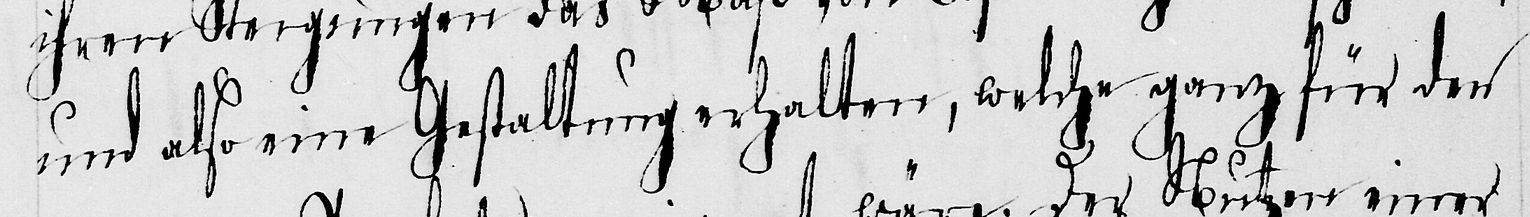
und also eine Gestaltung erhalten, welche ganz für den
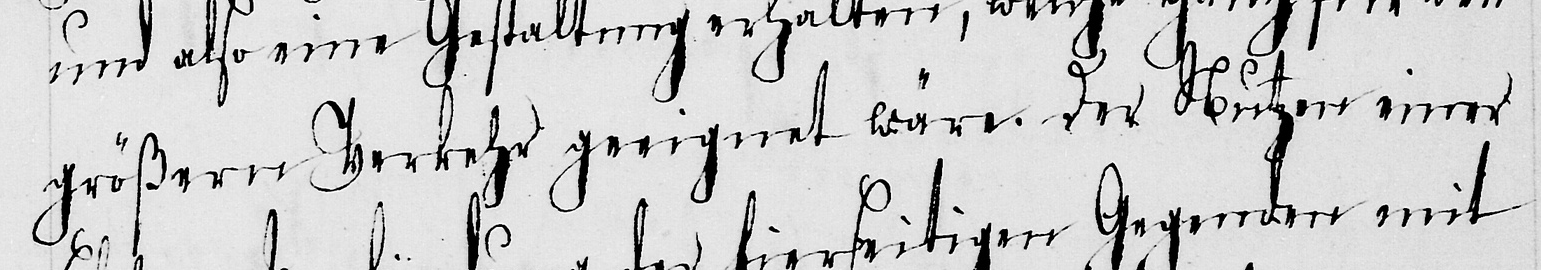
größern Verkehr geeignet wäre. Der Nutzen einer
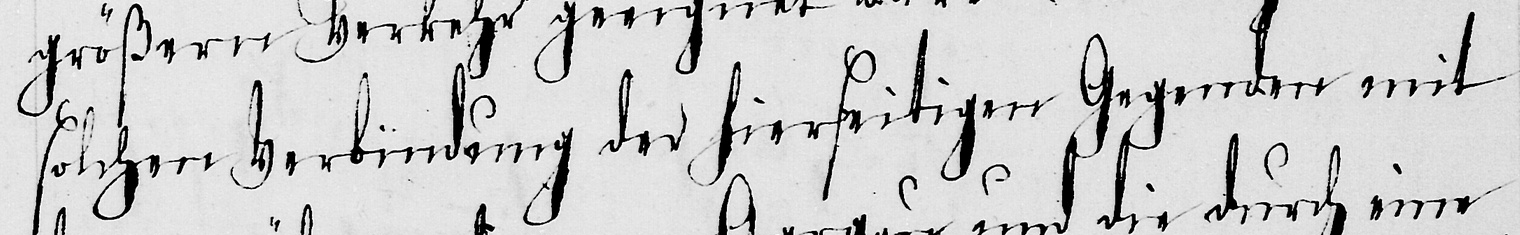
solchen Verbindung der hierseitigen Gegenden mit
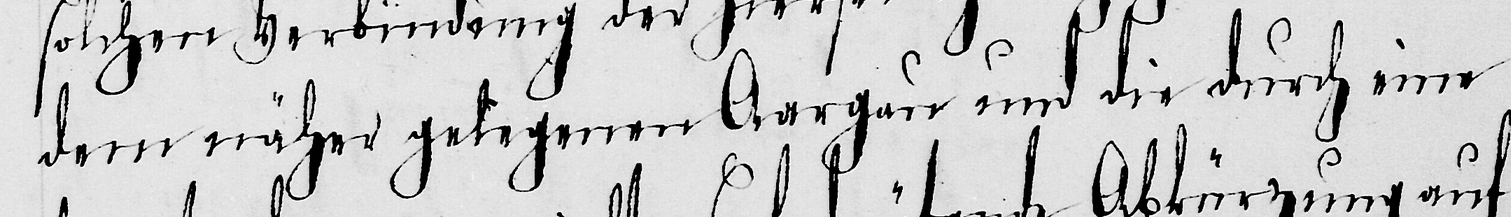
dem näher gelegenen Aargau und die durch eine
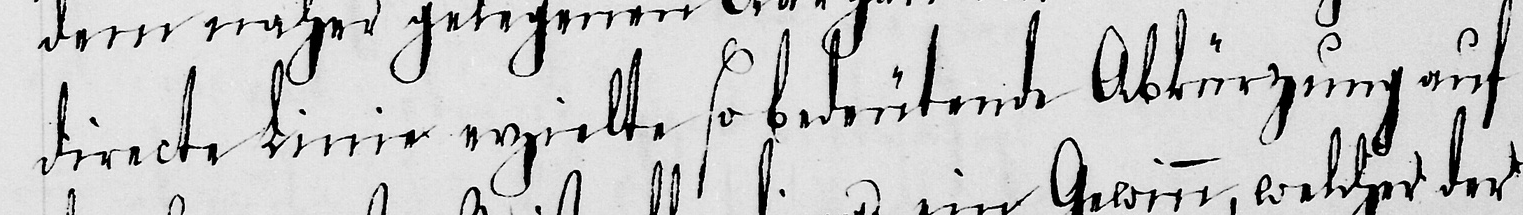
directe Linie erzielte so bedeutende Abkürzung auf
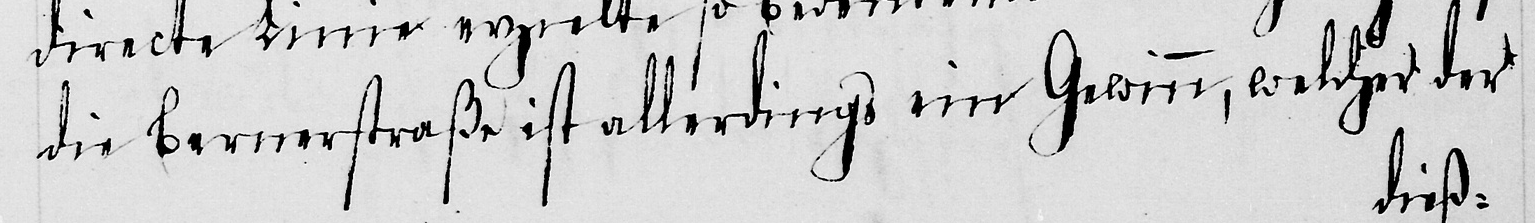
die Bernerstraße ist allerdings ein Gewinn, welcher der
